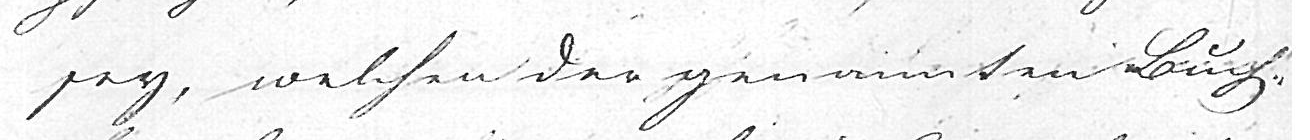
sey, welchen der genannten Buch-
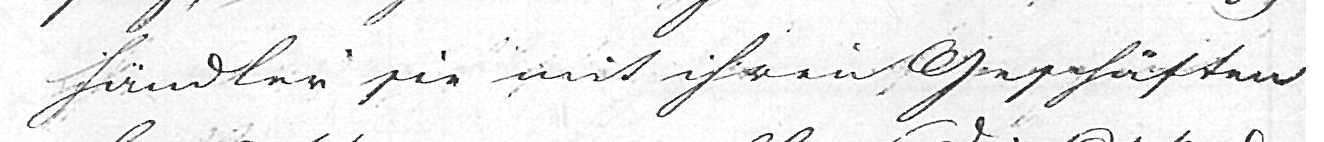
händler sie mit ihren Geschäften
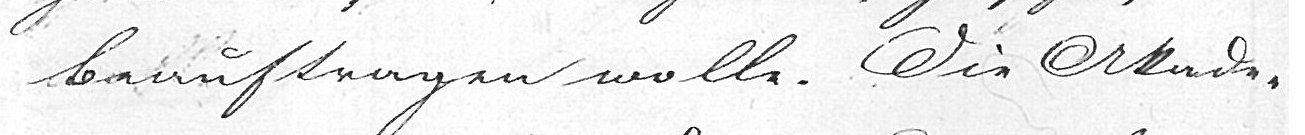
beauftragen wolle. Die Akade-
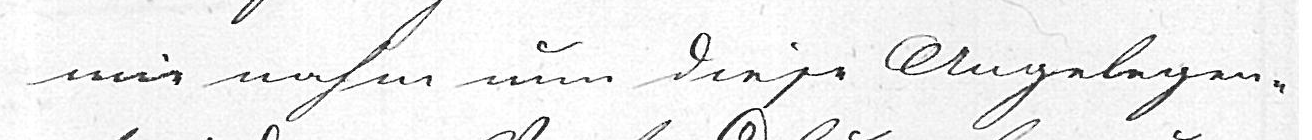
mie nahm nun die Angelegen-
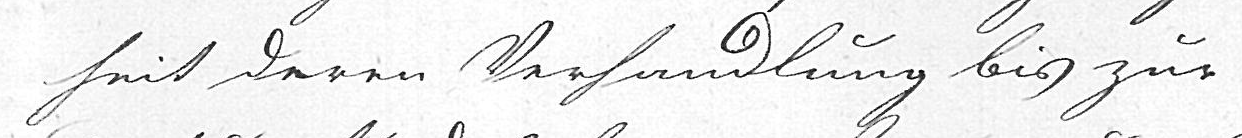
heit deren Verhandlung bis zur
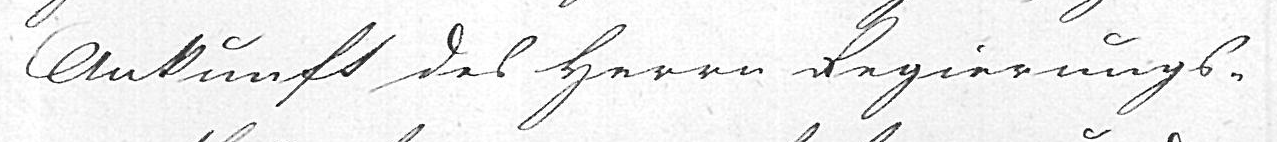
Ankunft des Herrn Regierungs-
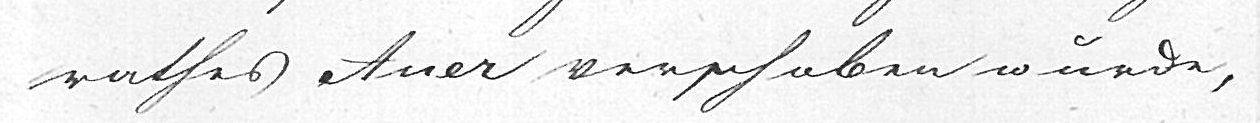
rathes Auer verschieben wurde,
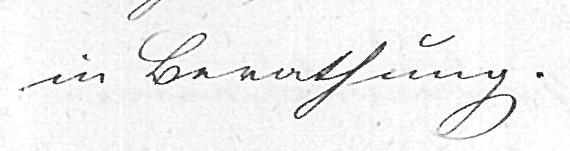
in Berathung.
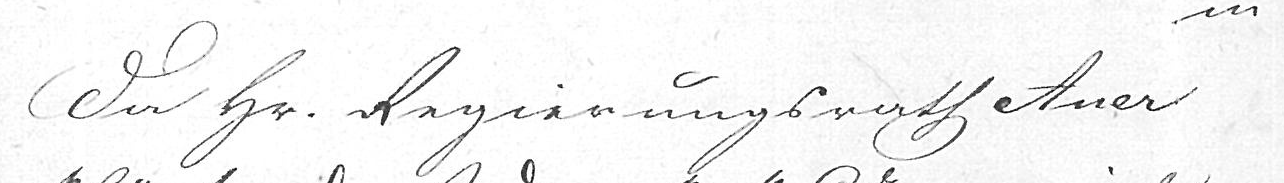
Der Hr. Regierungsrath Auer
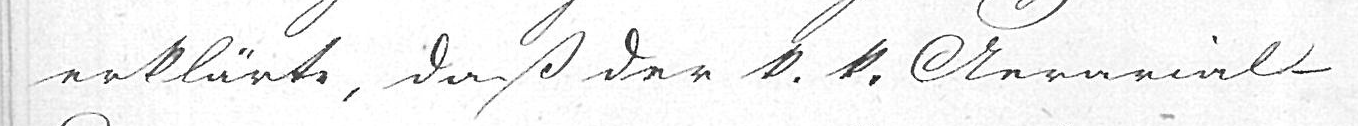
erklärte, daß der k. k. Aerarial-
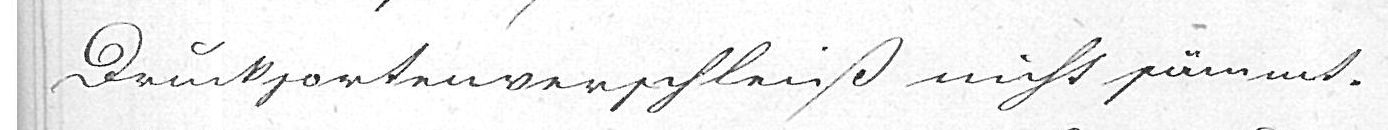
Drucksortenverschleiß nicht sämmt-
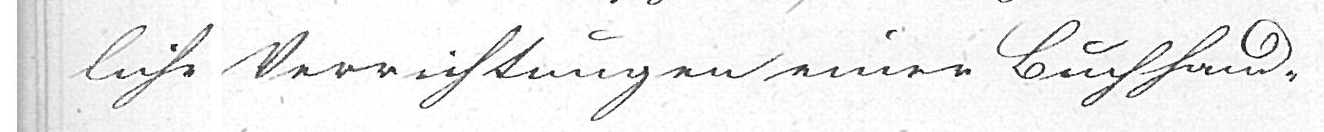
liche Verrichtungen einer Buchhand-
